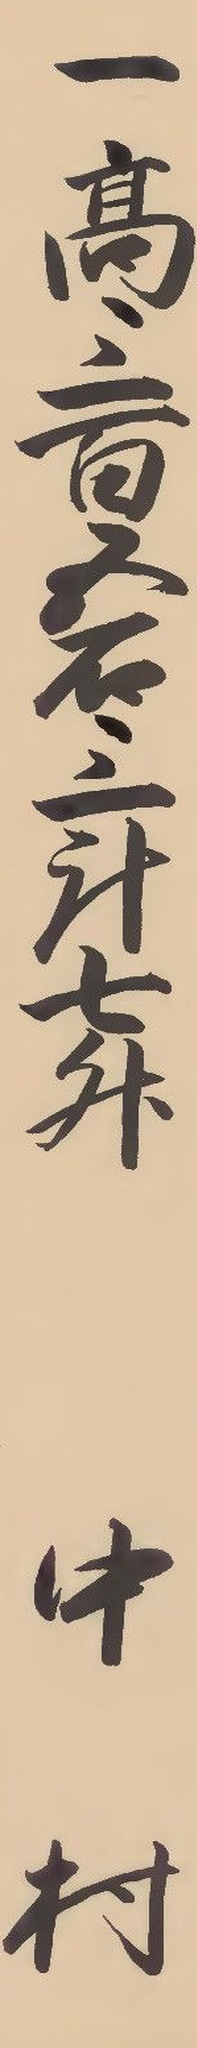一高三百五石三斗七升中村
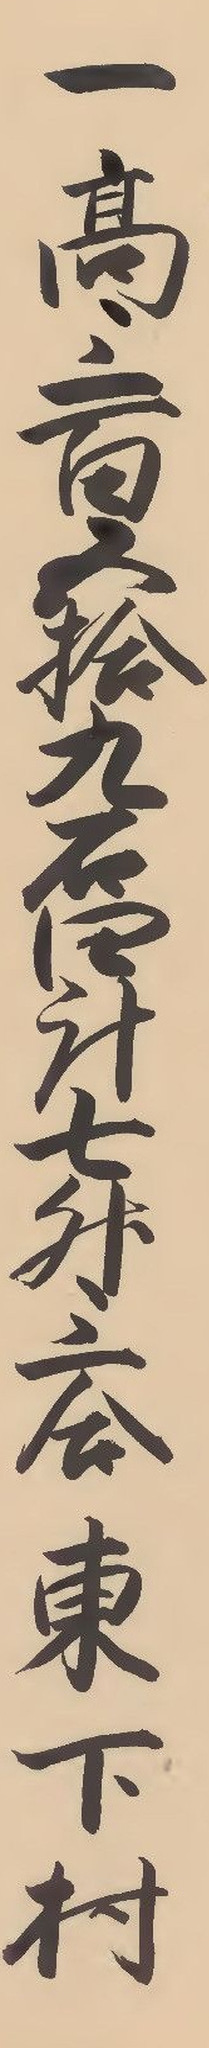一高三百五拾九石四斗七升三合東下村
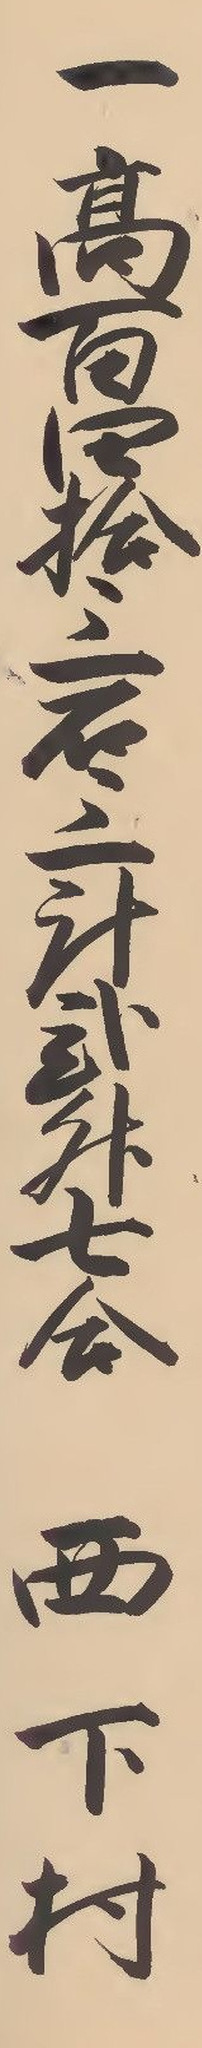一高百四拾三石三斗弐升七合西下村
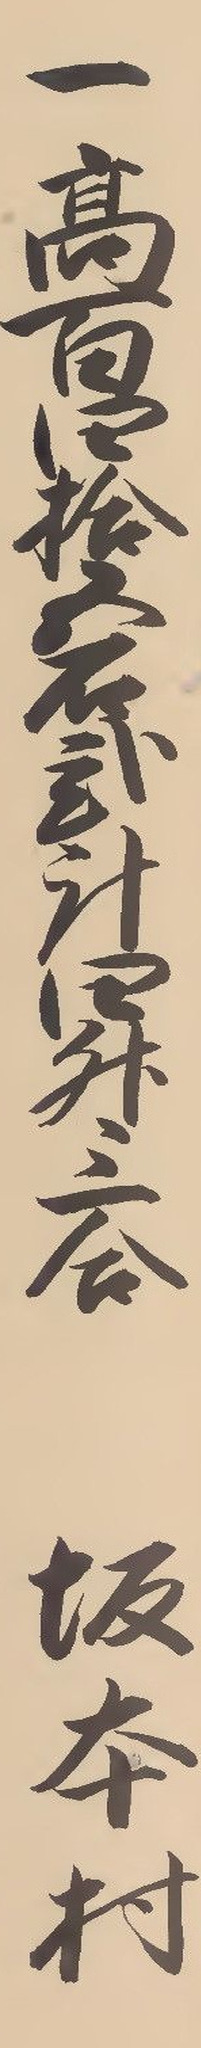一高百四拾五石弐計四升三合坂本村
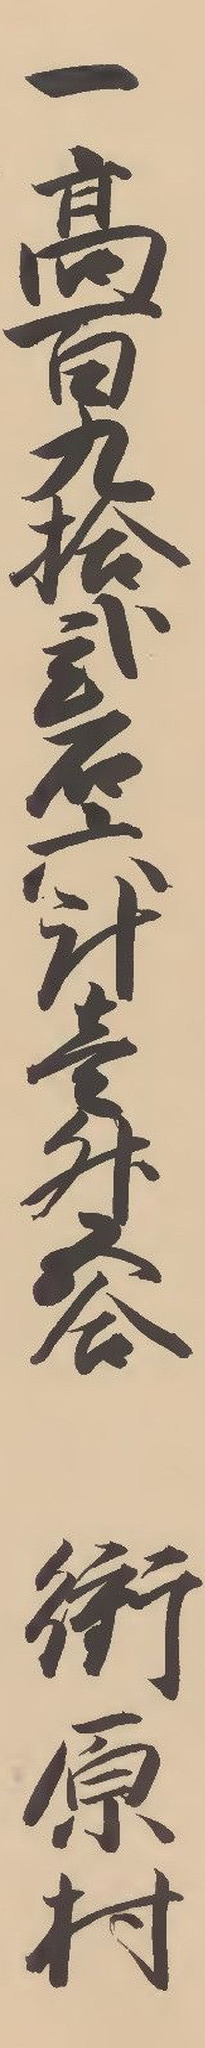一高百九拾弐石六斗壱升五合衛原村
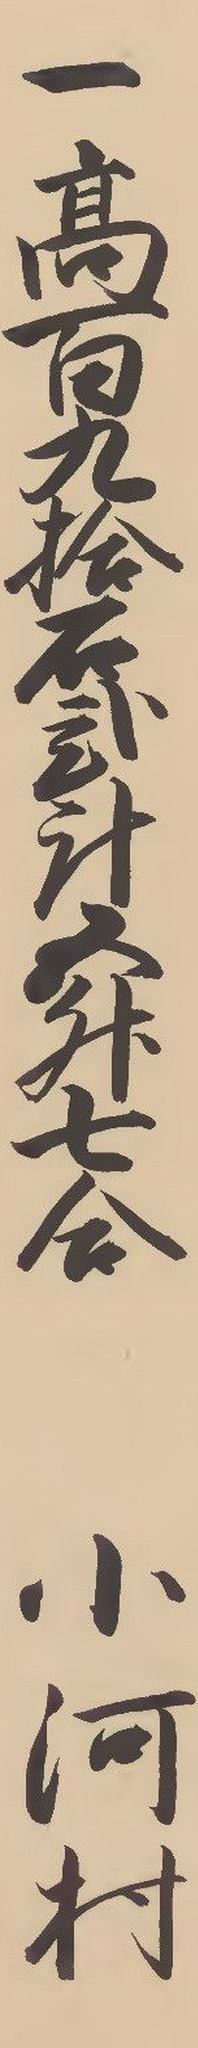一高百九拾石弐斗五升七合小河村
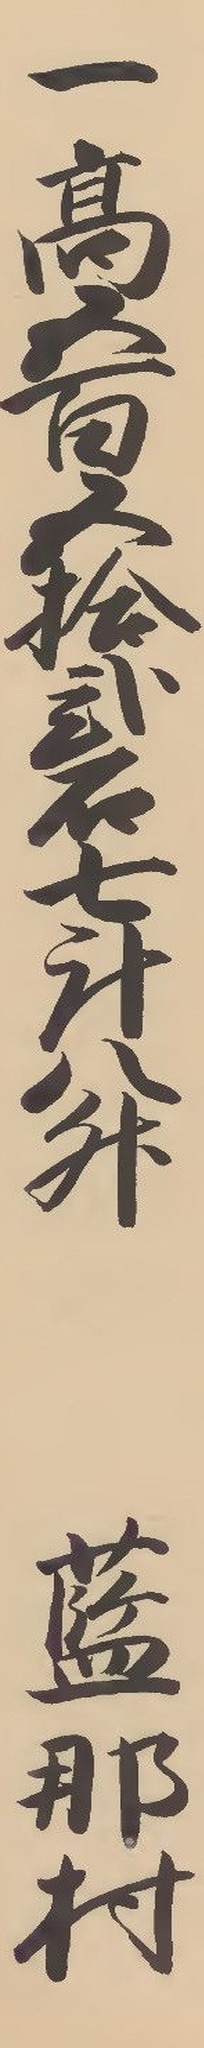一高五百五拾弐石七斗八升藍那村

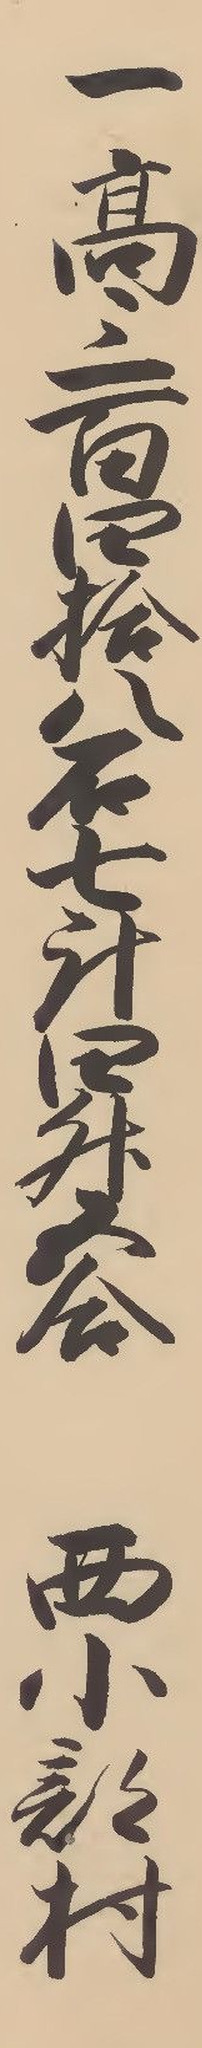一高三百四拾八石七斗四升五合西小部村
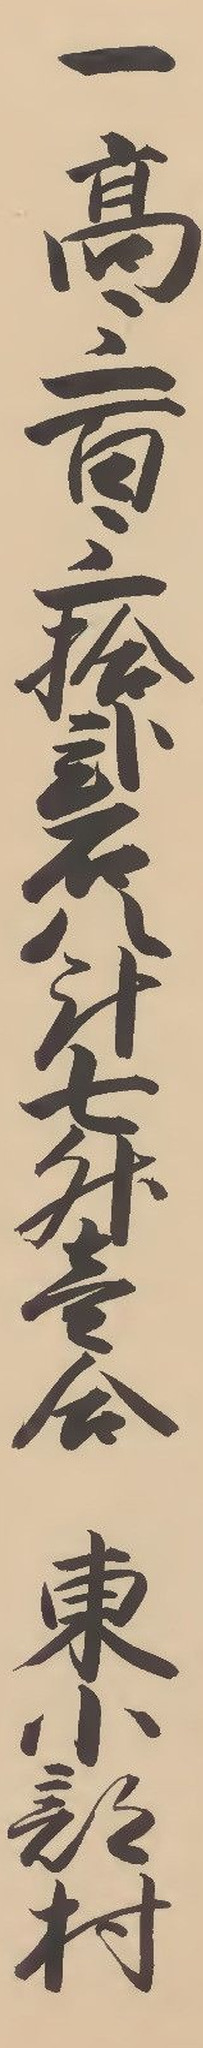一高三百三拾弐石八斗七升壱合東小部村
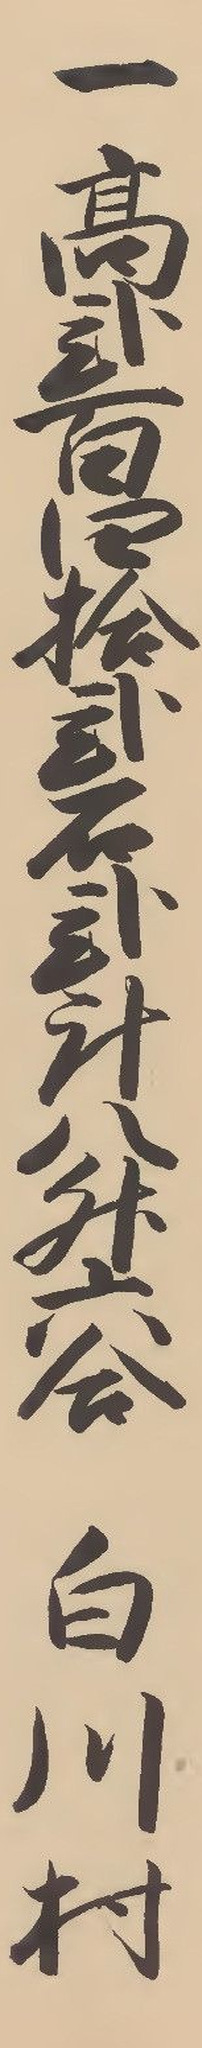一高弐百四拾弐石弐斗八升六合白川村
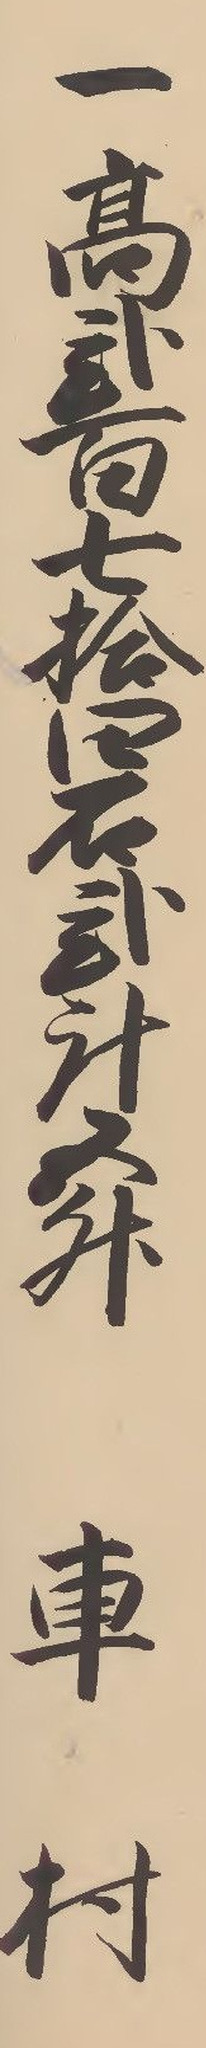一高弐百七拾四石弐斗五升車村
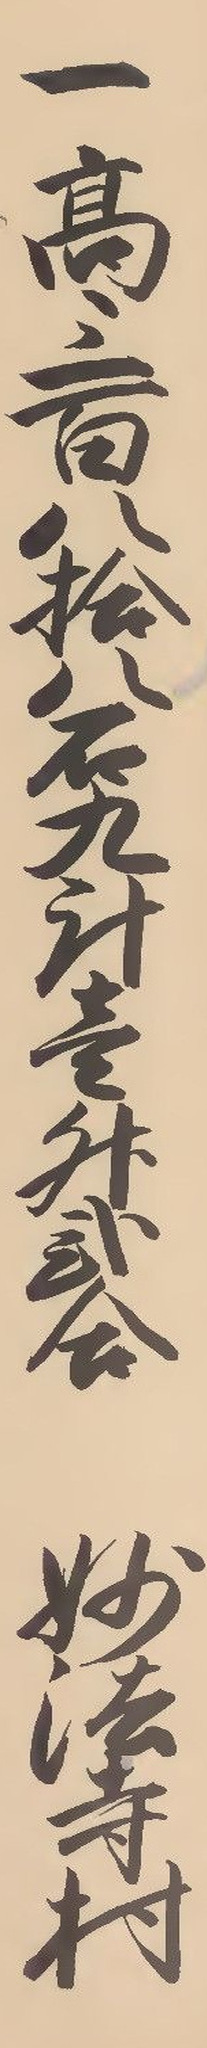一高三百八拾八石九斗壱升弐合妙法寺村
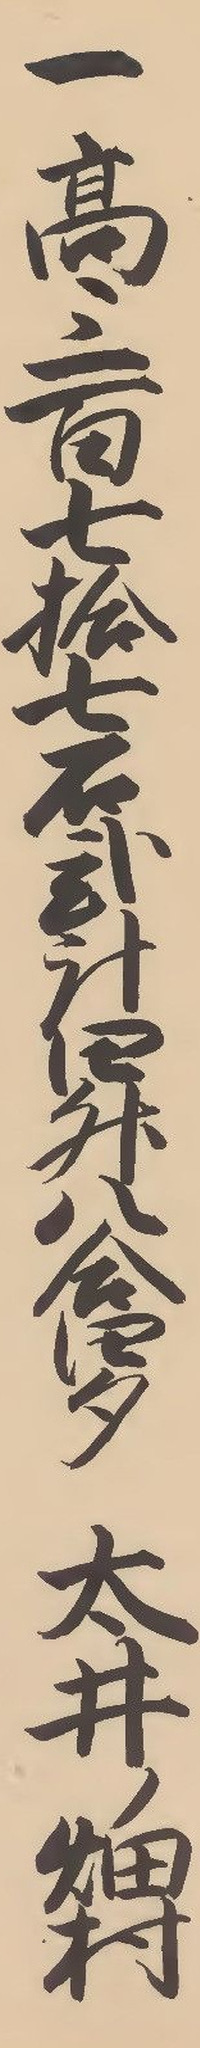一高三百七拾七石弐斗四升八合四勺太井ノ畑村
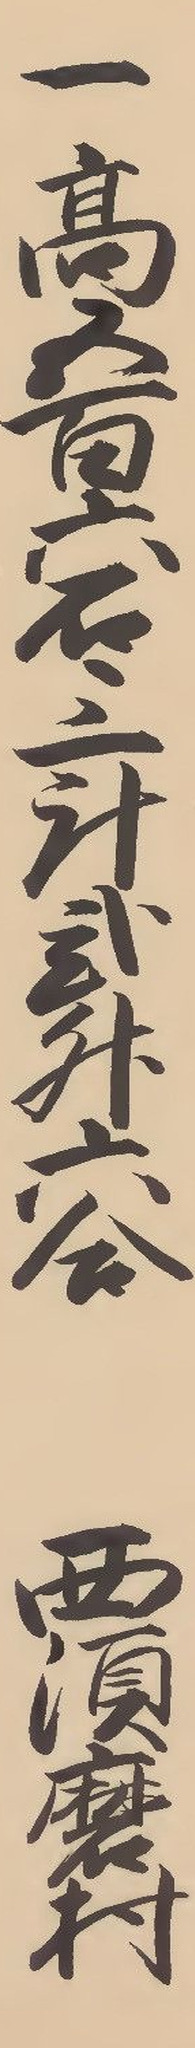一高五百六石三斗弐升六合西須磨村
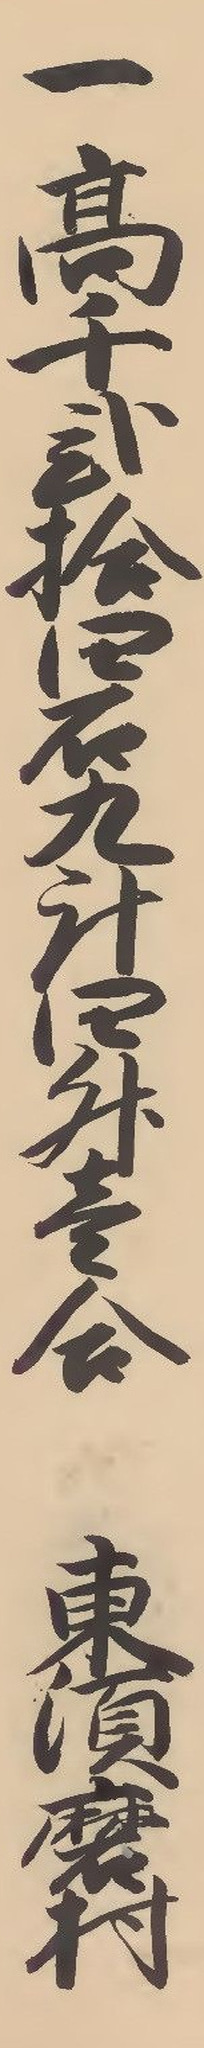一高千弐拾四石九斗四升壱合東須磨村

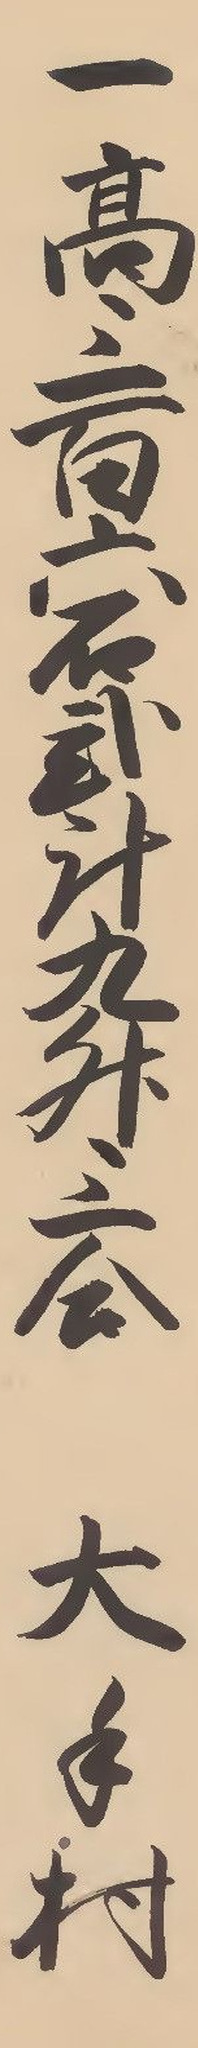一高三百六石弐斗九升三合大手村
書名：摂津国郷帳
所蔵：国立公文書館 National Archives of Japan
